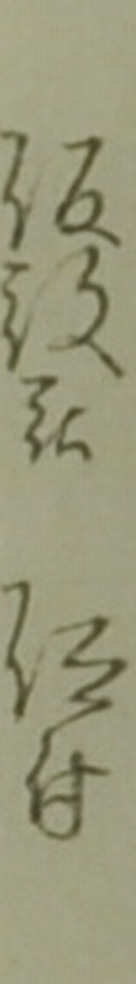仮役被仰付

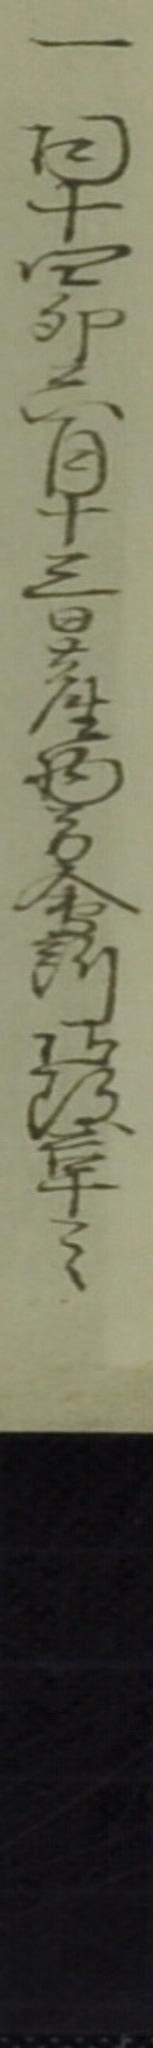一同十四卯六月十三日産物方会所御改革之
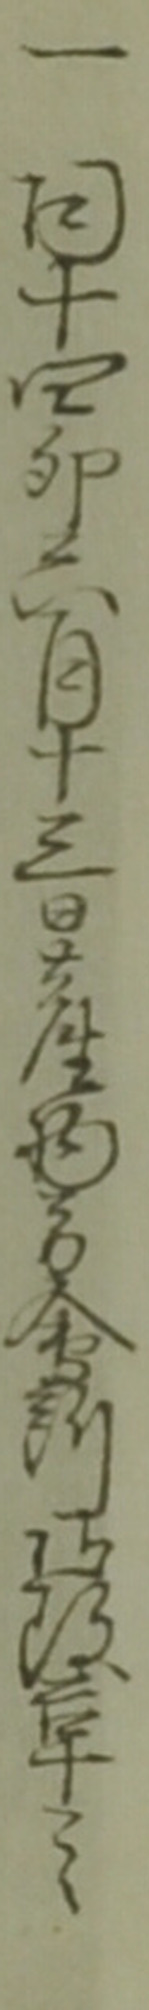一同十四卯六月十三日産物方会所御改革之
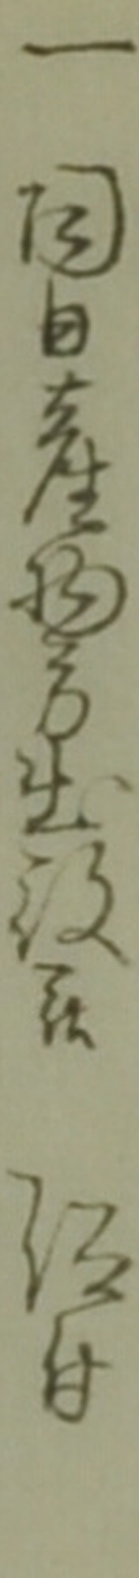一同日産物方出役被仰付
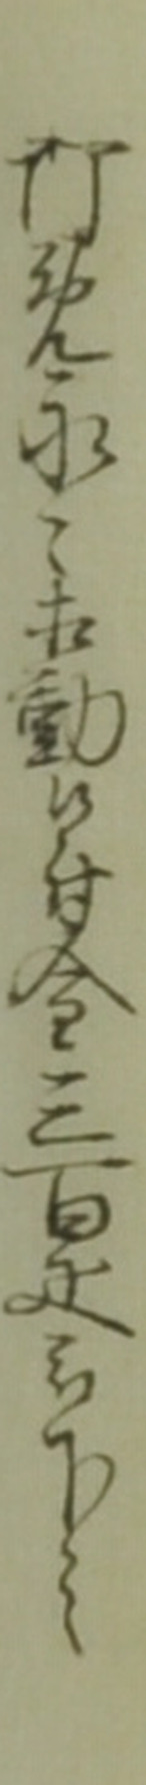御免永々相勤候付金三百疋被下之
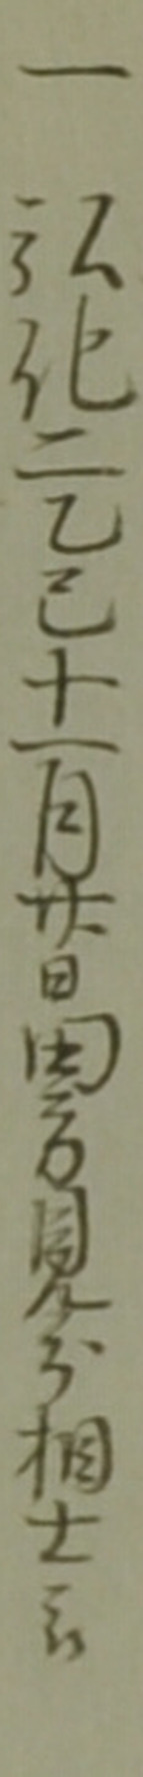一弘化二乙巳十一月廿日田方見分相士被
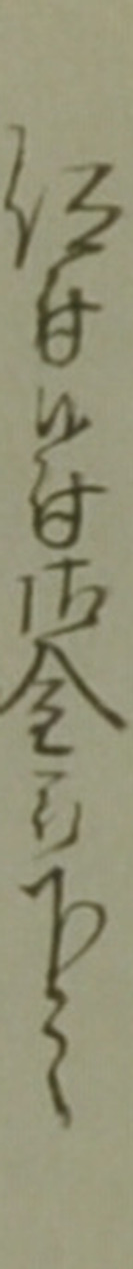仰付候付御金被下之

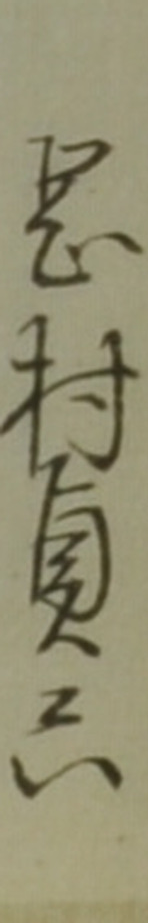岡村貞六

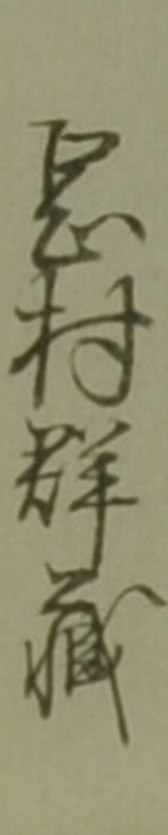岡村群蔵
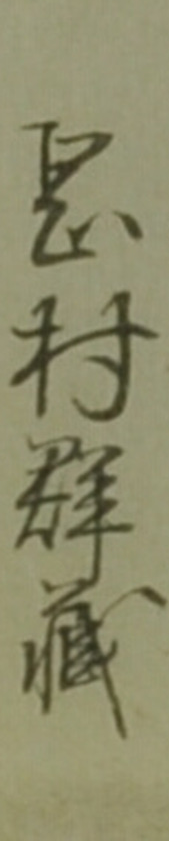岡村群蔵

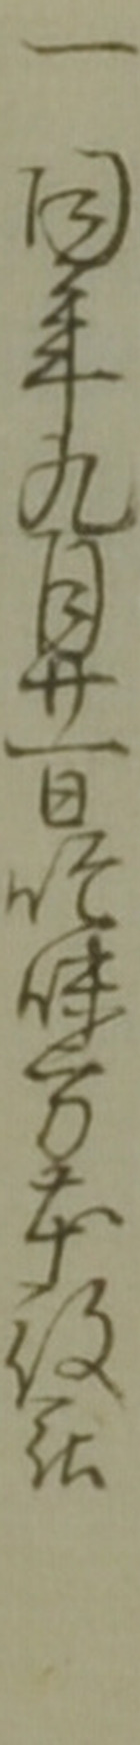一同年九月廿一日吟味方本役被
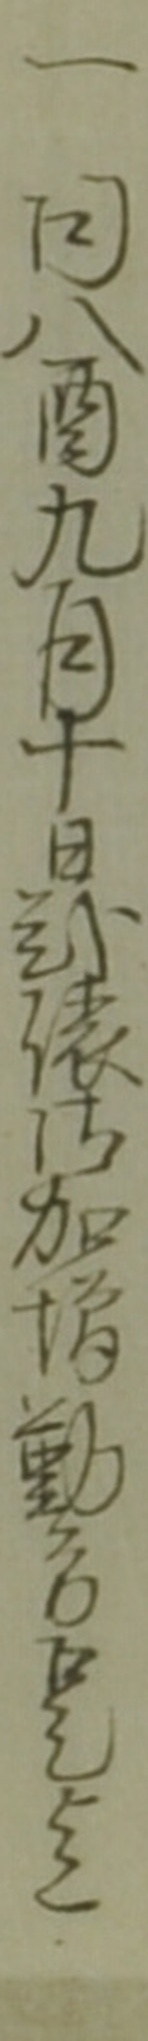一同八酉九月十日弐俵御加増勤方是迄
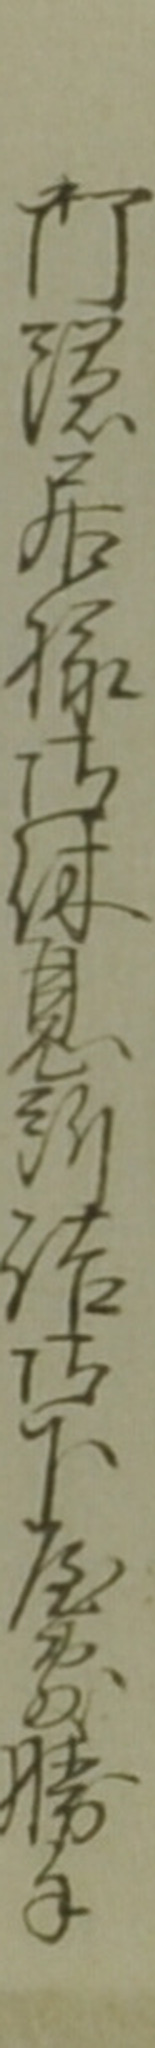御隠居様御休息所詰御下屋敷勝手
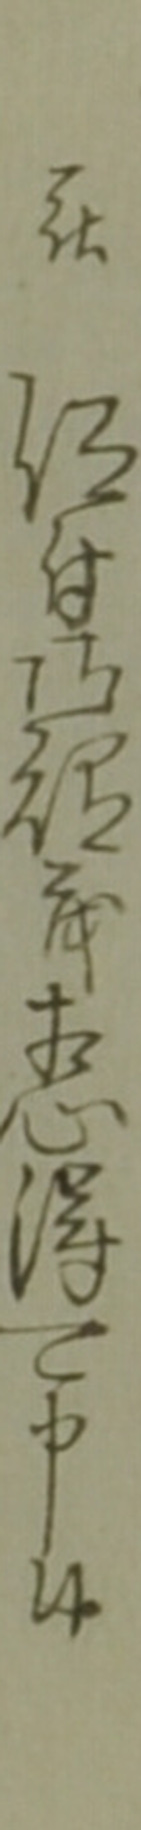被仰付御賄茂相心得可申候
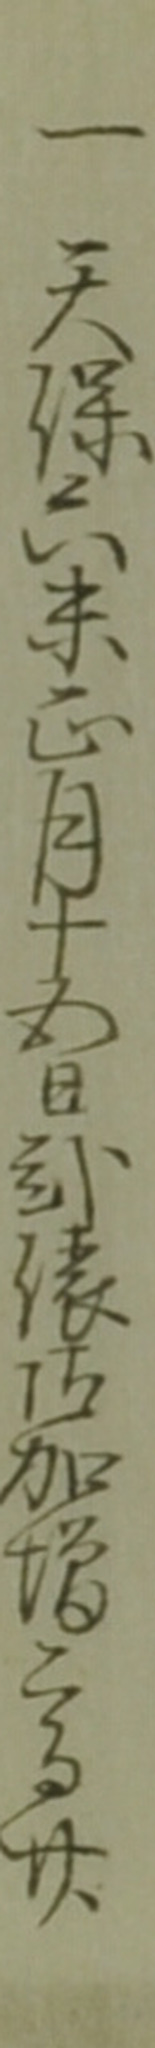一天保六未正月十五日弐俵御加増高廿
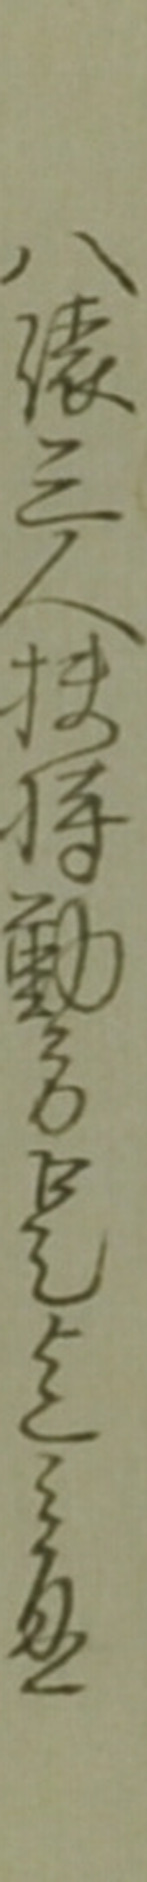八俵三人扶持勤方是迄之通
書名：無足諸士勤仕録（一）
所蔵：伊那市立高遠町図書館・合同会社AMANE
